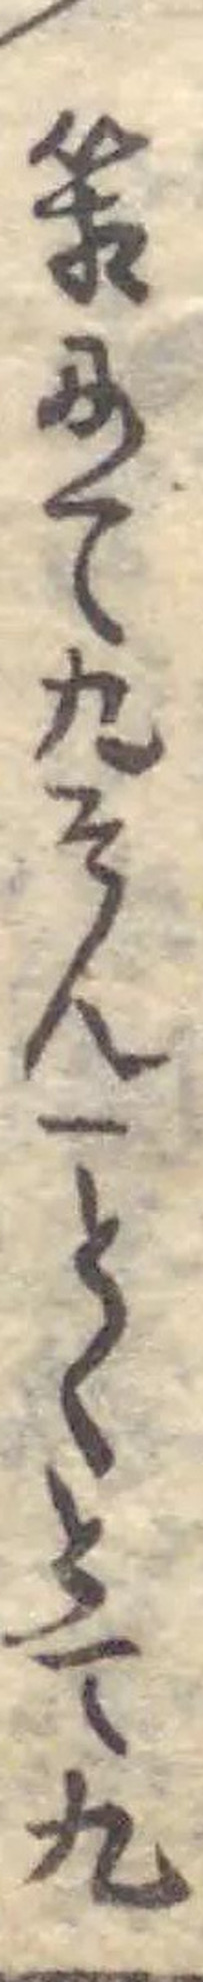箱にて九そん一とくとて九
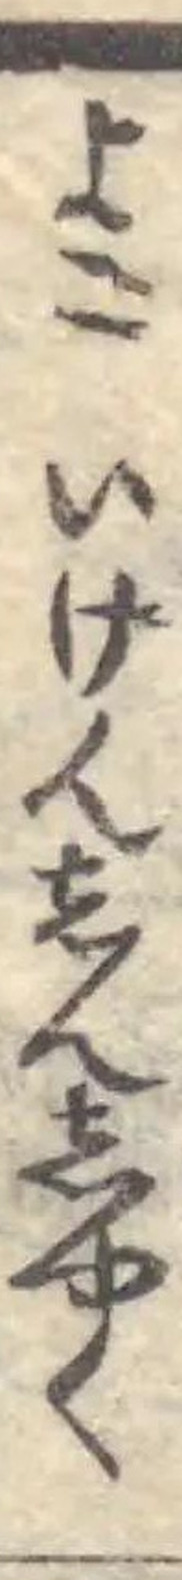よこいけんしんしやく
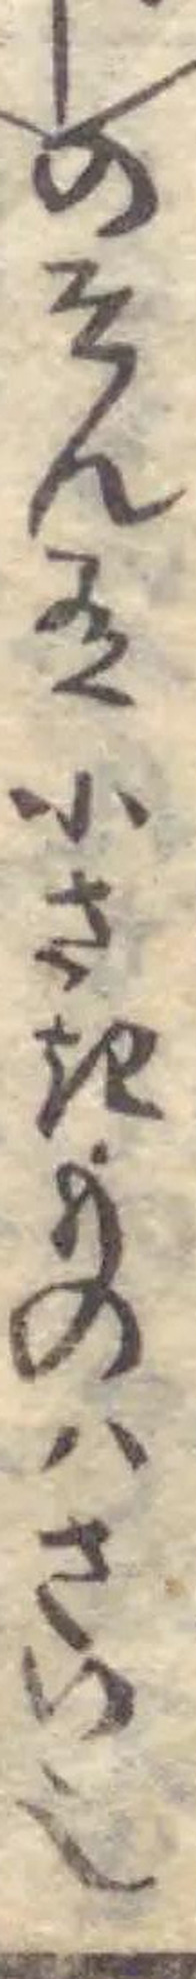のそん有小さきものはさい也
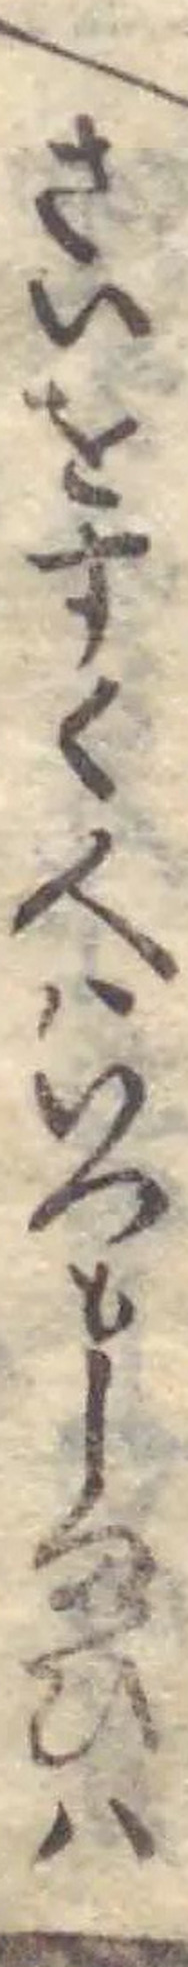さいをすく人はいつもしまひは
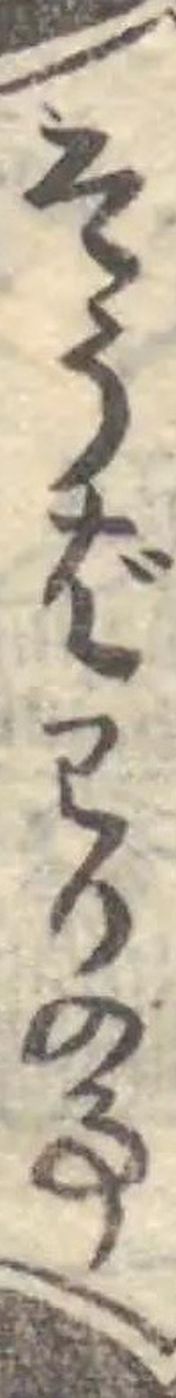そうばわりの事』
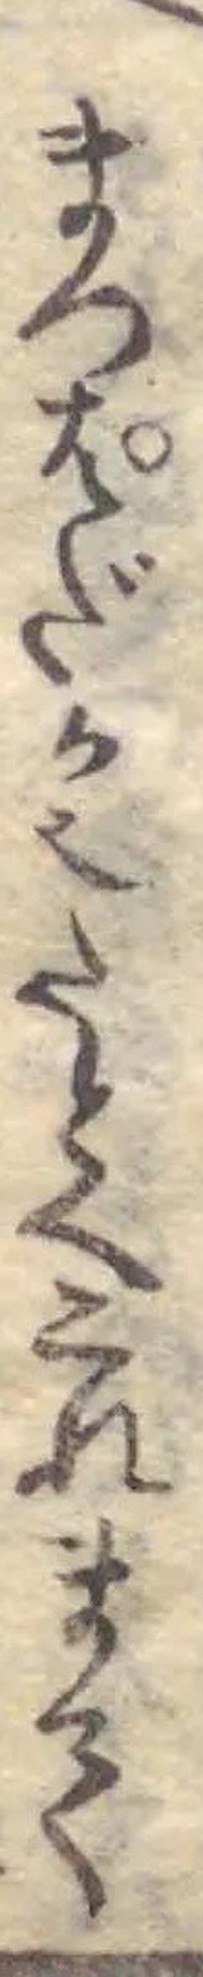まつぱだか也たとへこれまて
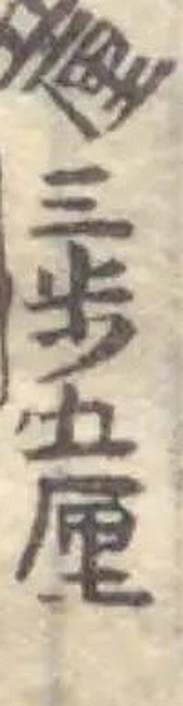三歩五厘
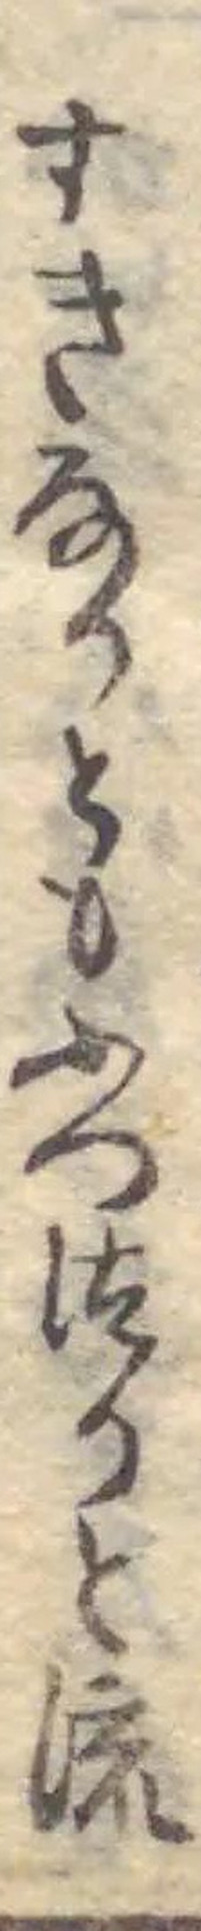すきなりともふつつりと流
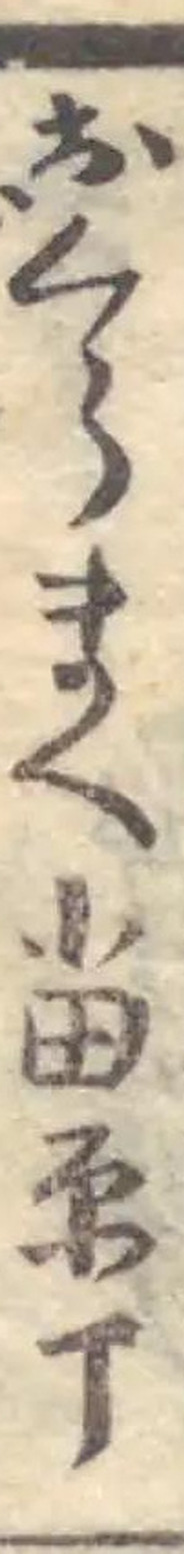おくらまへ小田原丁
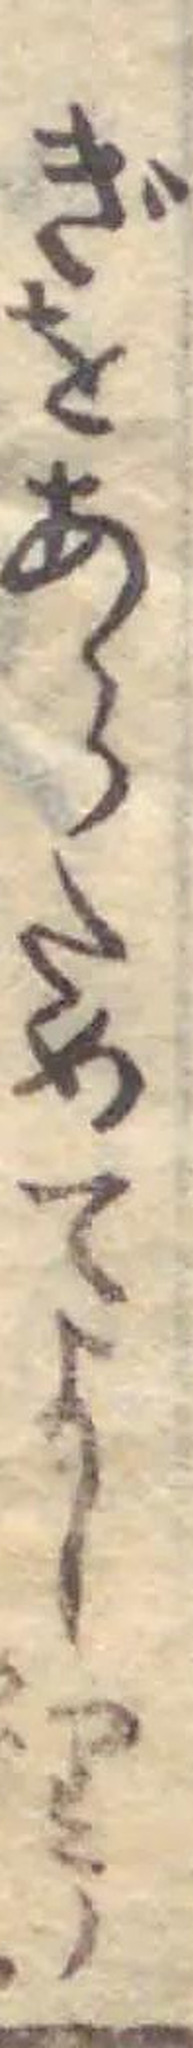ぎをあらためてよしりう
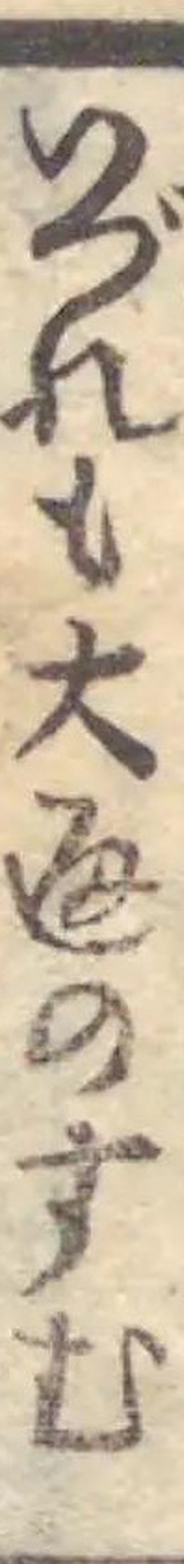いづれも大通のすむ
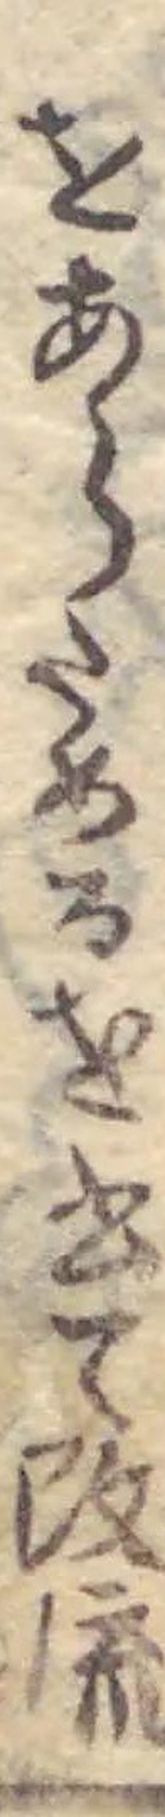をあらためるを書て改流
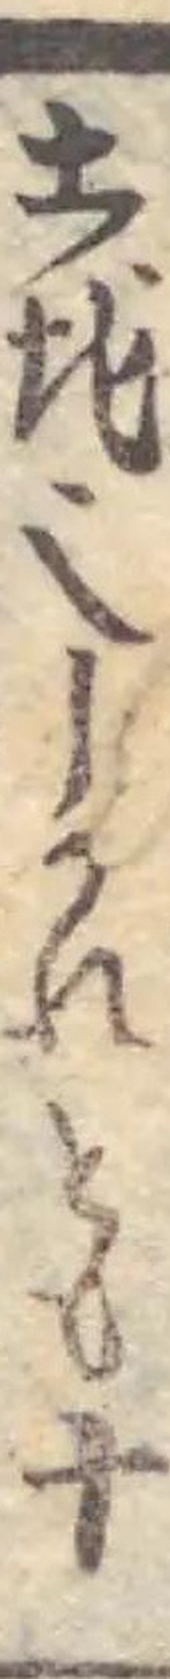土地也しかれとも十
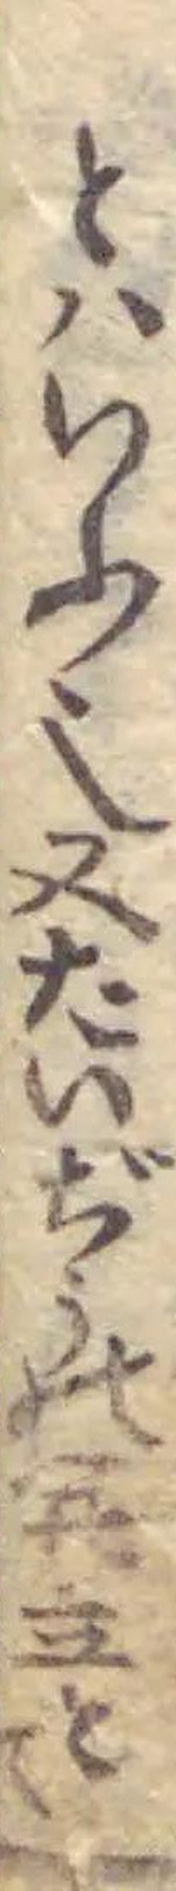とはいふ也又たいぢうの開平とて
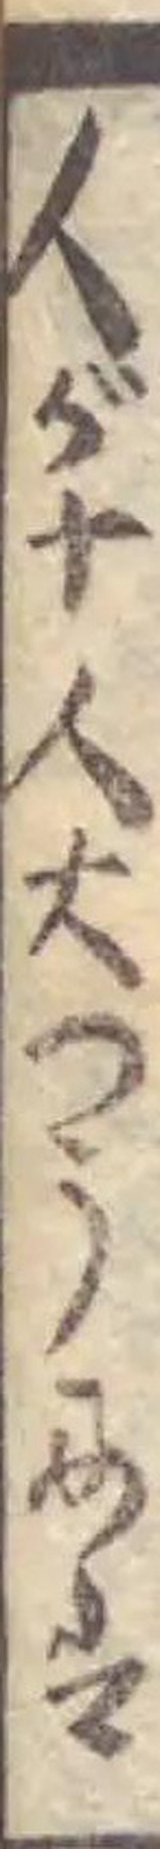人が十人代つうには
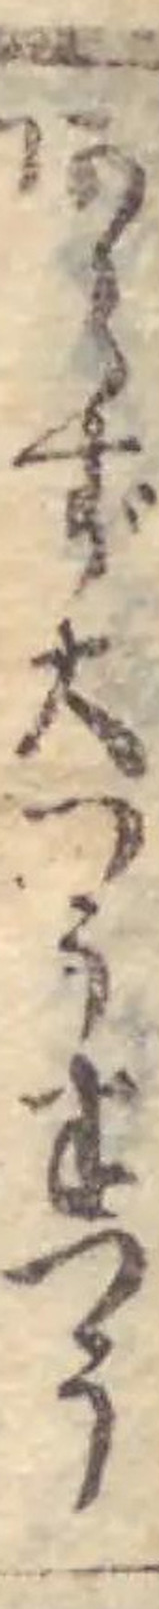あらず代つう半つう
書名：大通人好記
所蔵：国立国会図書館 National Diet Library, JAPAN
